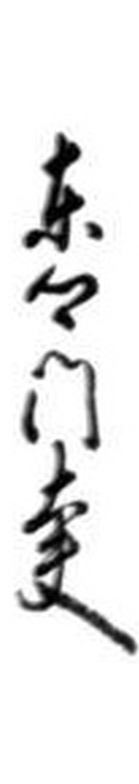東郷門大夫
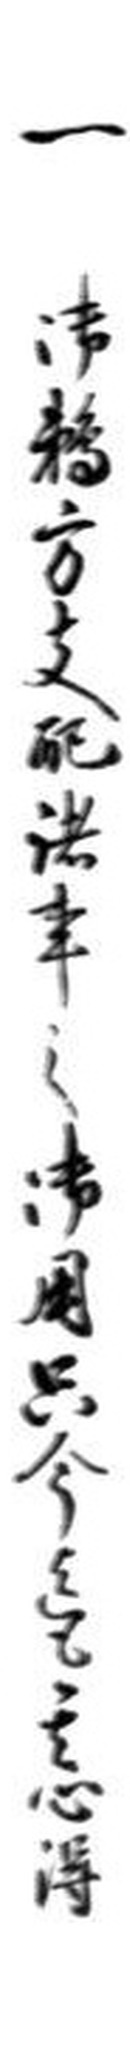一御鵜方支配諸事之御用只今迄も其心得
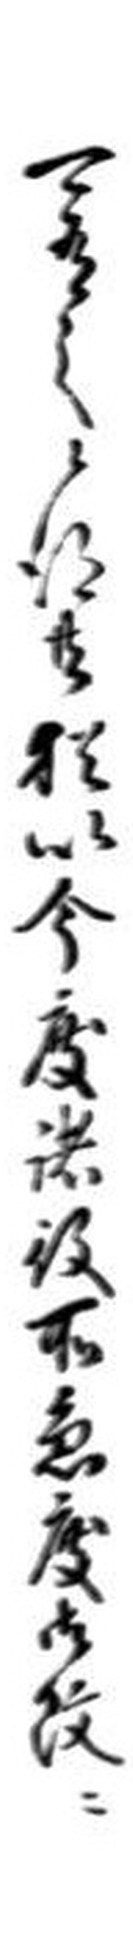可有之候得共猶以今度諸役所急度御改ニ
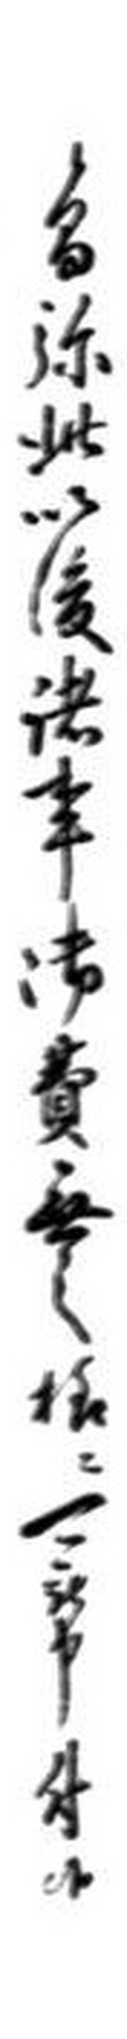候間弥此以後諸事御費無之様ニ可被申付候
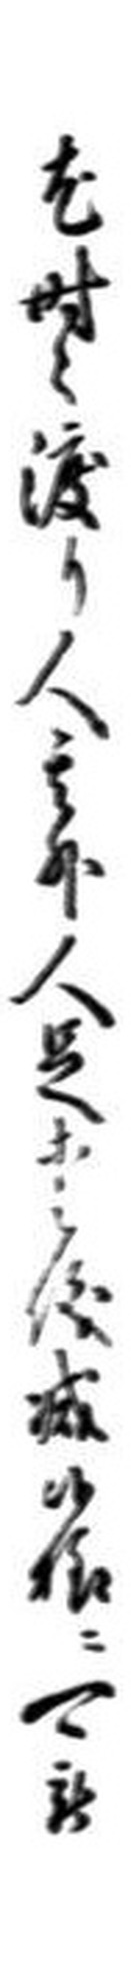尤時々渡り人其外人足等之儀減候様ニ可被
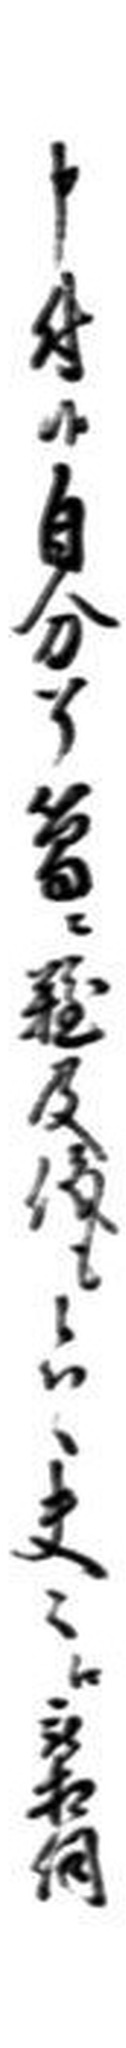申付候自分了簡ニ難及儀も候ハヽ夫々江被相伺
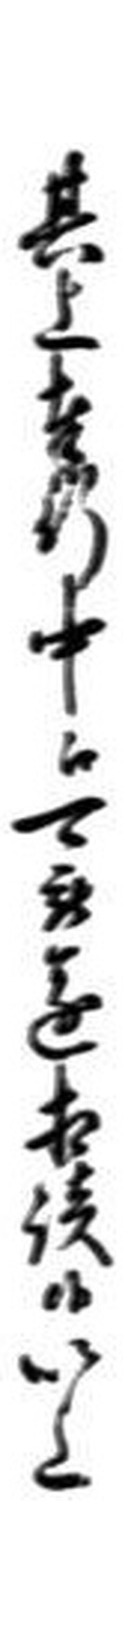其上奉行中江可被遂相談候以上
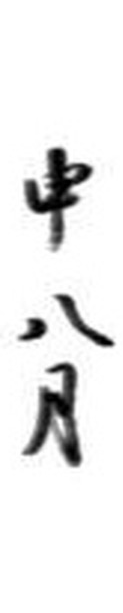申八月
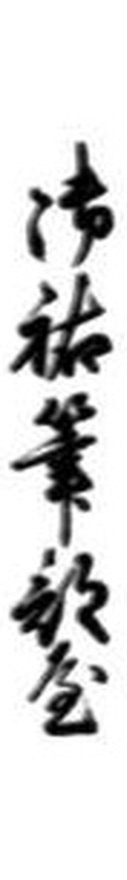御祐筆部屋

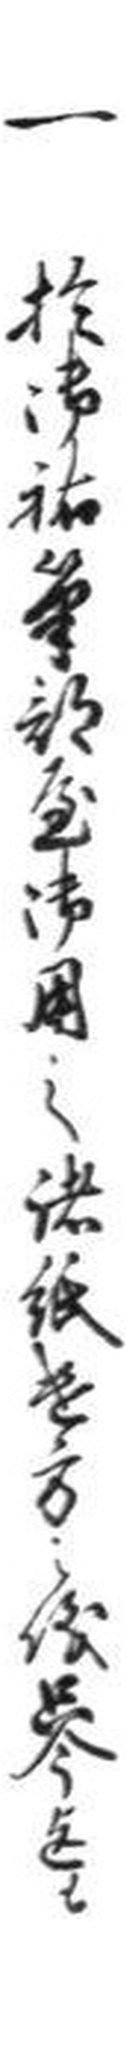一於御祐筆部屋御用之諸紙遣方之儀只今迄も
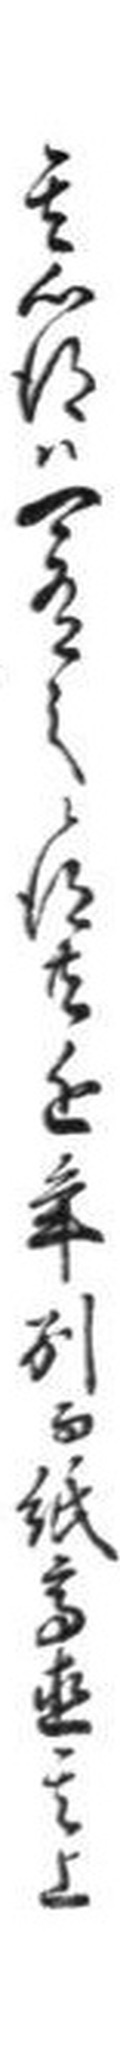其心得ハ可有之候得共近年別而紙高直其上
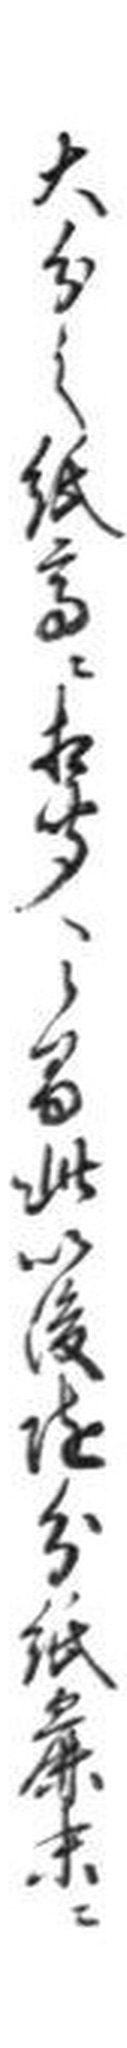大分之紙高ニ相聞へ候間此以後随分紙麁末ニ
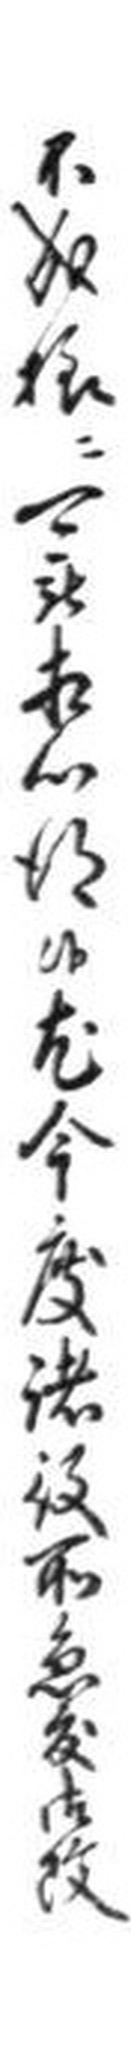不成様ニ可被相心得候尤今度諸役所急度御改
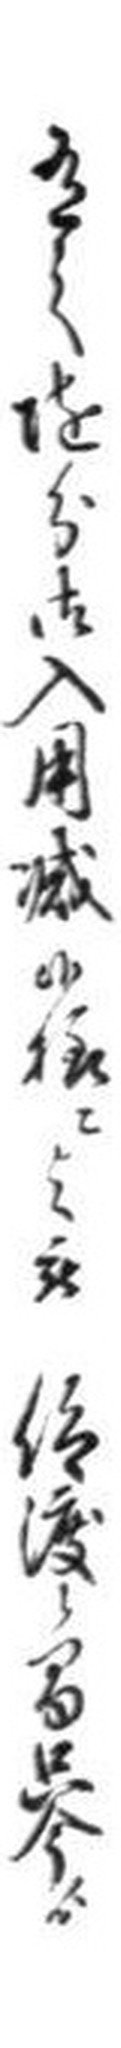有之随分御入用減候様ニと被仰渡候間只今ゟ
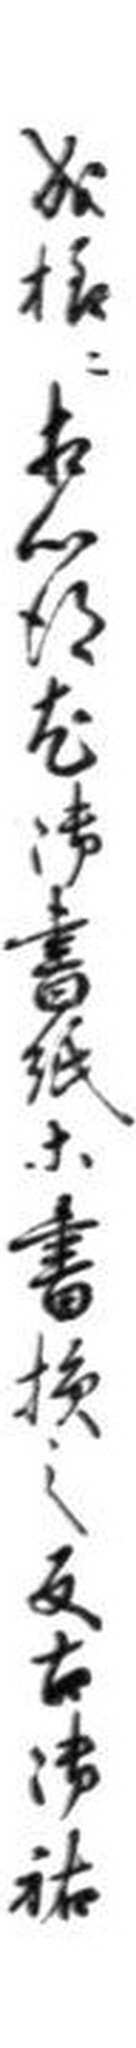成様ニ相心得尤御書紙等書損之反古御祐
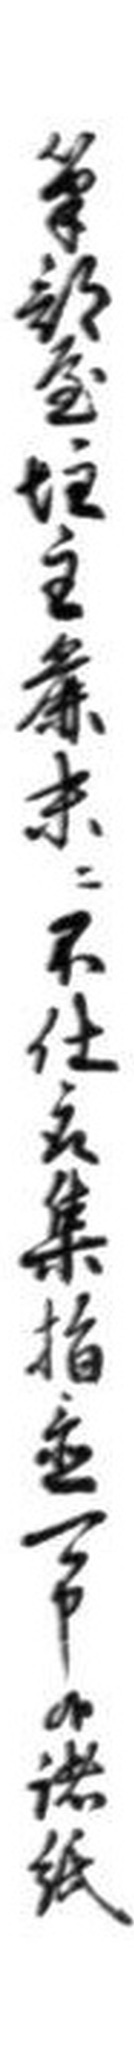筆部屋坊主麁末ニ不仕取集指置可申候諸紙
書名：家譜 三十一 吉邦公 享保元年
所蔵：福井県文書館 Fukui Prefectural Archives
